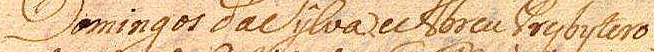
Domingos da Sylva e Abreu Presbytero
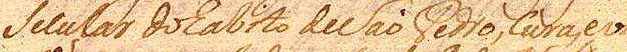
Secular do habito de Saõ Pedro, Cura, e vi
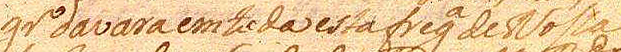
gr.o da vara em toda esta freg.a de Nossa
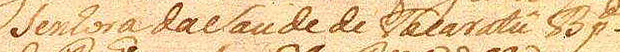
Senhora da Saude de Tacaratú Bp.do
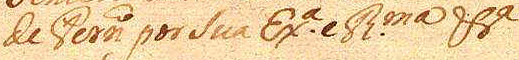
de Pernco por Sua Ex.a e R.ma &ra
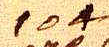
104
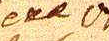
era cris
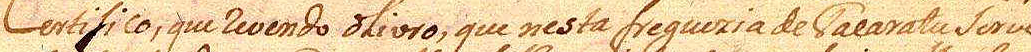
Certifico, que Revendo o Livro, que nesta freguezia de Tacaratu serve
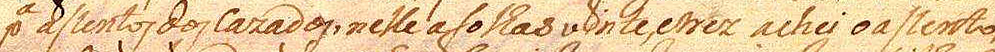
pa assentos dos cazados, nelle a folhas vinte, e trez achei o assento;
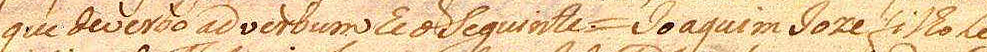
que deverbo ad verbum he o Seguinte= Ioaquim Ioze filho Le
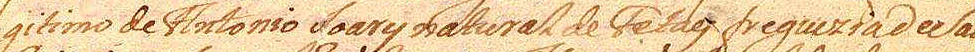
gitimo de Antonio Soares natural de Fetaes freguezia de Saõ
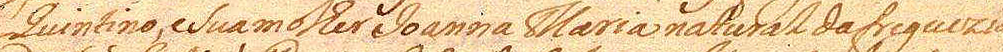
Quintino, e sua molher Ioanna Maria natural da freguezia
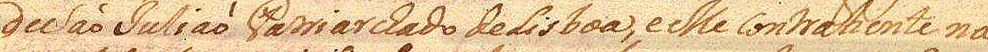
de Saõ Iuliaõ Patriarchado de Lisboa, e elle contrahente na
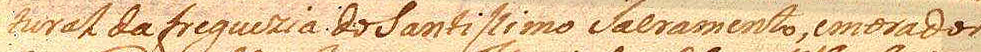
turaL da freguezia do Santissimo Sacramento, e morador
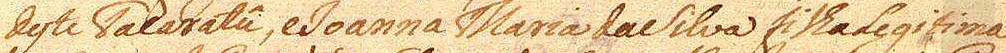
deste Tacaratú, e Ioanna Maria da Silva filha Legitima
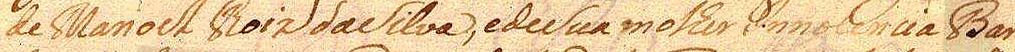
de Manoel Roiz da Silva, e de sua molher Innocencia Bar
